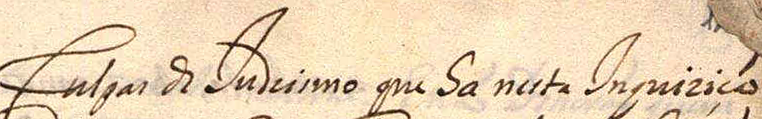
Culpas de Judeismo que ha nesta Jnquizição
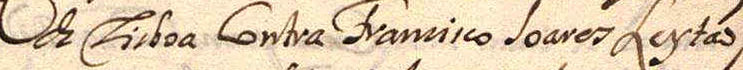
de Lisboa Contra Francisco Soares Leytão
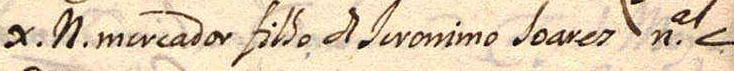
x. N. mercador filho de Jeronimo Soares n.al e
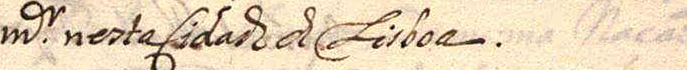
m.or nesta Cidade de Lisboa.
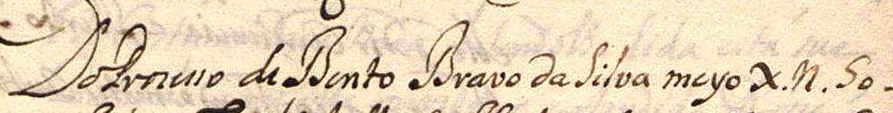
Do Processo de Bento Bravo da Silva meyo X. N. ho
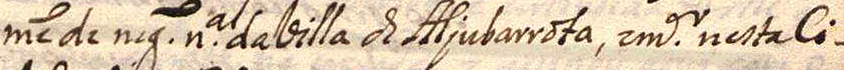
me̅ de neg.o n.al da Villa de Aljubarrota, e m.or nesta Ci
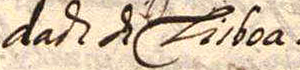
dade de Lisboa.
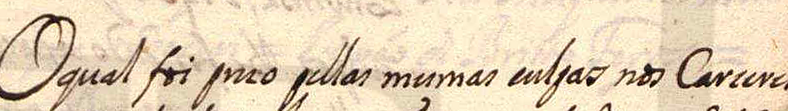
O qual foi prezo pellas mesmas culpas nos Carceres
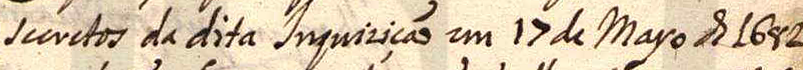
secretos da dita Jnquizição em 17 de Mayo de 1682
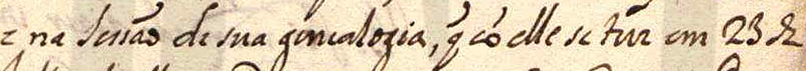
e na sessão de sua genealogia, q̅ co̅ elle se teve em 23 de
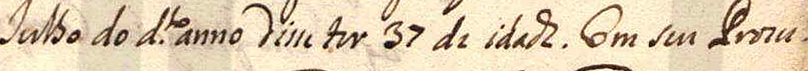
Julho do d.to anno disse ter 37 de idade. Com seu Proces
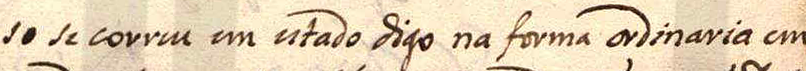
so se correu em estado digo na forma ordinaria em
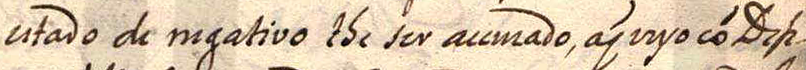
estado de negativo the ser accuzado, a q̅ veyo co̅ Defe
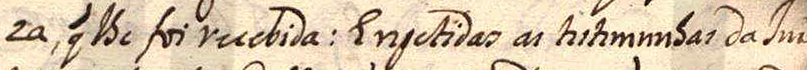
za, q̅ lhe foi recebida: E repetidas as testemunhas da Jus
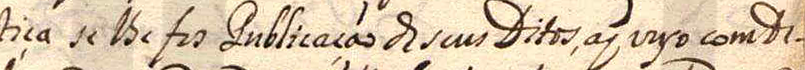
tiça se lhe fes Publicação de seus Ditos, a q̅ veyo com De
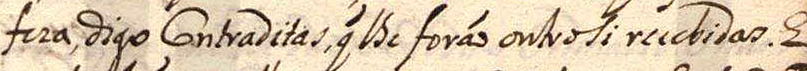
feza, digo, Contraditas, q̅ lhe forão outrosi recebidas. E
